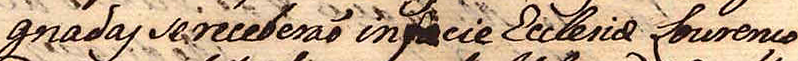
gnadas se receberaõ in facie Ecclesia Lourenço
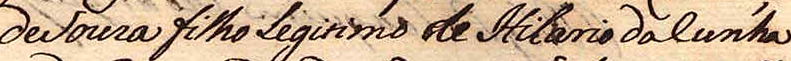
de Souza filho Legitimo de Hilario da Cunha
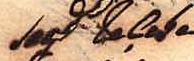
Seg.do Reçebi
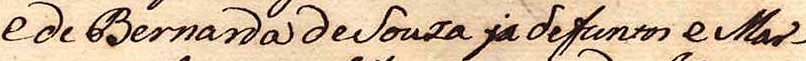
e de Bernarda de Souza ja defuntos e Mar
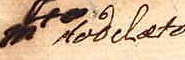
m.to no delato
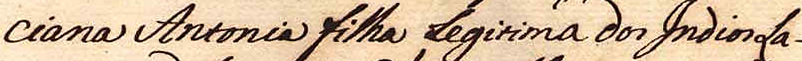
ciana Antonia filha legitima dos Jndios La
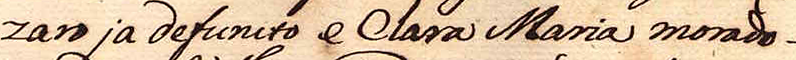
zaro ja defunto e Clara Maria morado
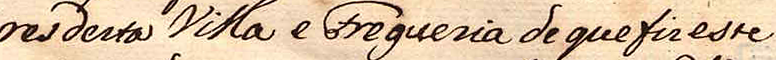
res desta Villa e Freguezia de que fiz este
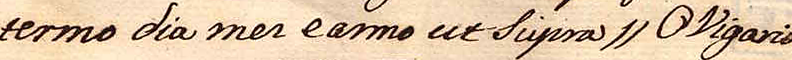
termo dia mes e anno ut Supra // O Vigario
